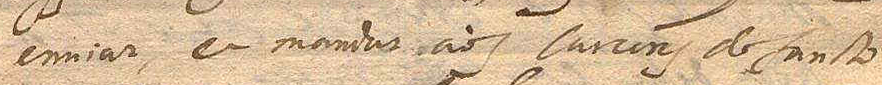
enuiar, e mandar aos Carceres do sancto
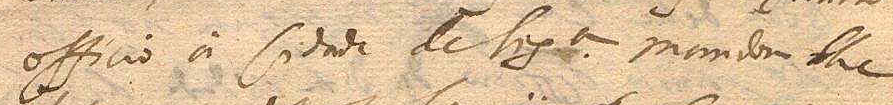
officio à Cidade de lix.a mandou lhe
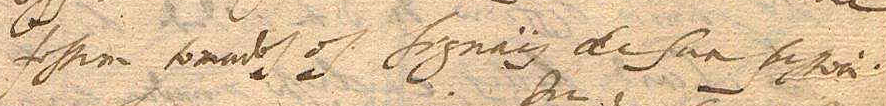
fossem tomados os signais de sua pessoa
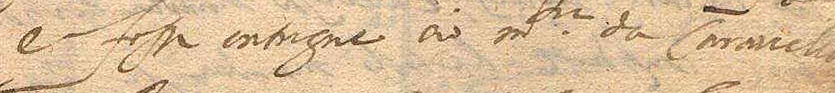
e fosse entregue ao mtr.e da Carauella
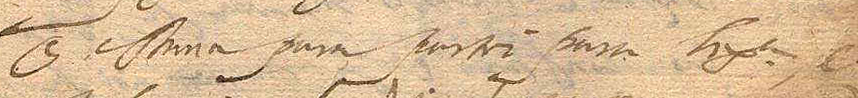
q̄ estaua para partir para lixa, e
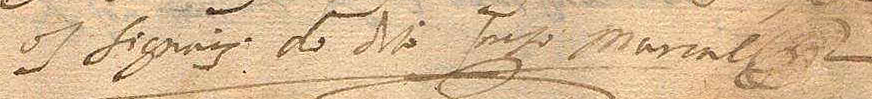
os signais do dito preso marçal f̄rz
